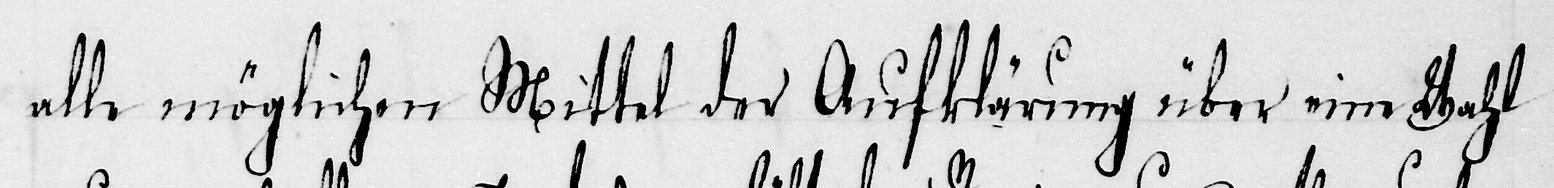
alle möglichen Mittel der Aufklärung über eine Wahl
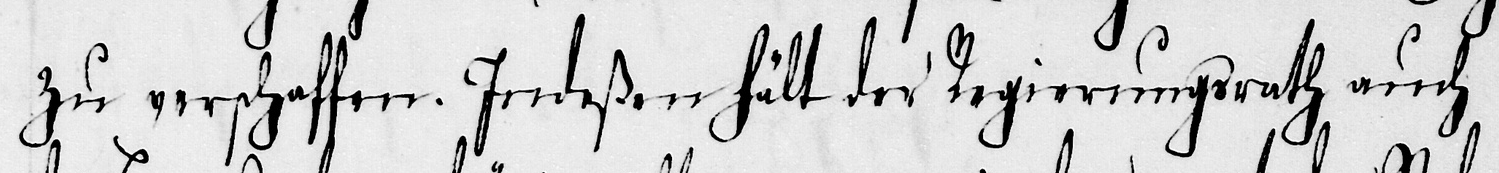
zu verschaffen. Indeßen hält der Regierungsrath auch
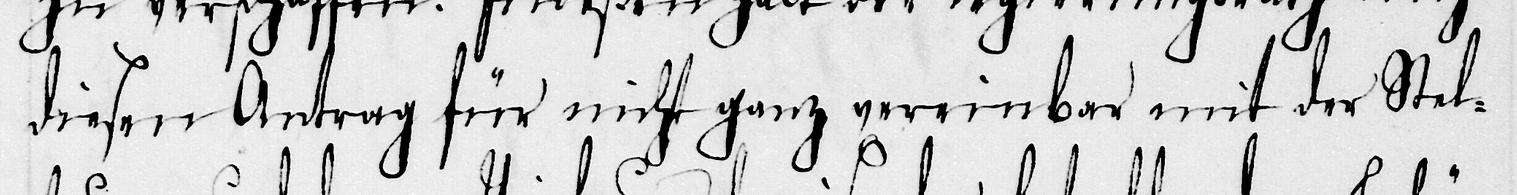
diesen Antrag für nicht ganz vereinbar mit der Stel¬
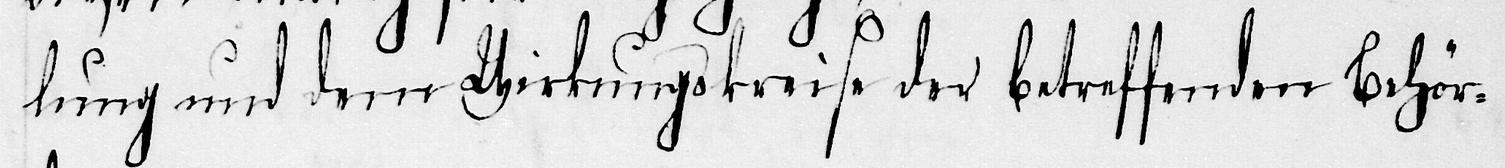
lung und dem Wirkungskreise der betreffenden Behör¬
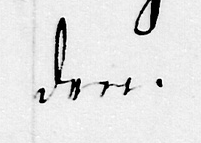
den.
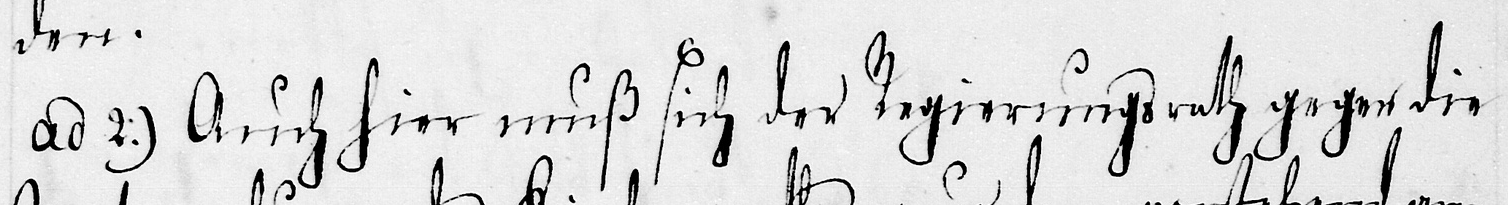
ad 2:) Auch hier muß sich der Regierungsrath gegen die
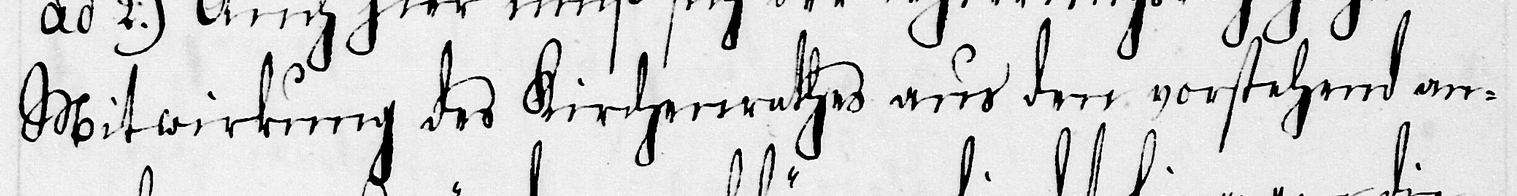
Mitwirkung des Kirchenrathes aus den vorstehend an¬
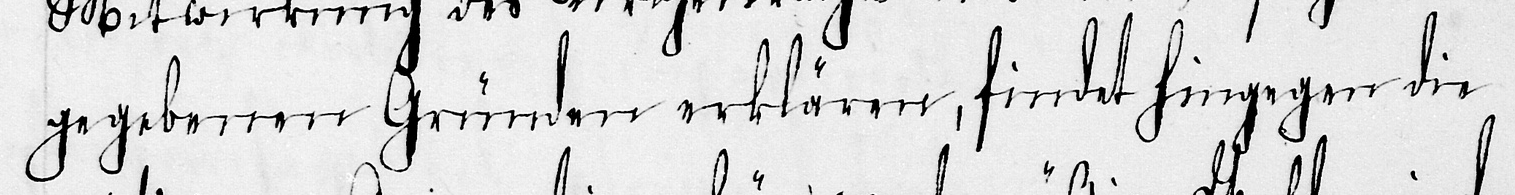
gegebenen Gründen erklären, findet hingegen die
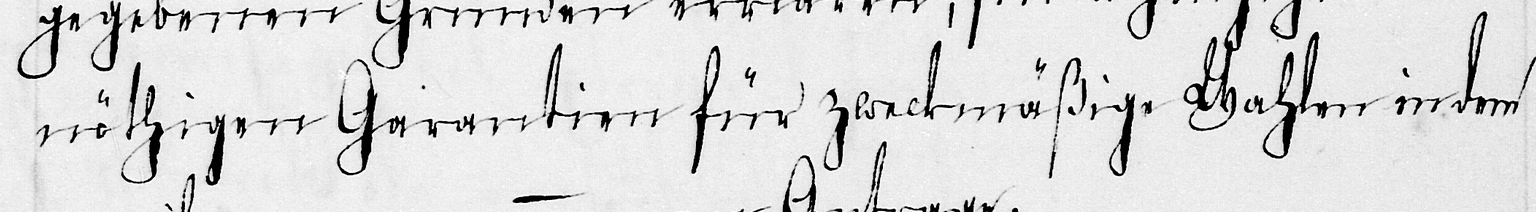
nöthigen Garantien für zweckmäßige Wahlen in dem
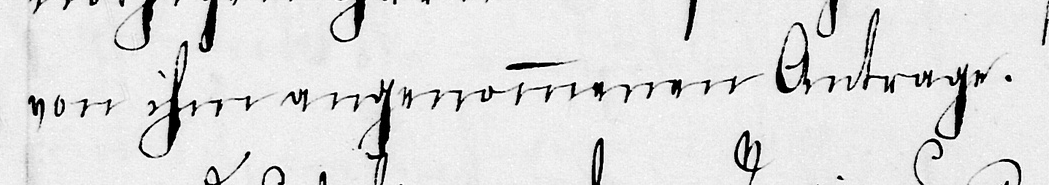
von ihm angenommenen Antrage.
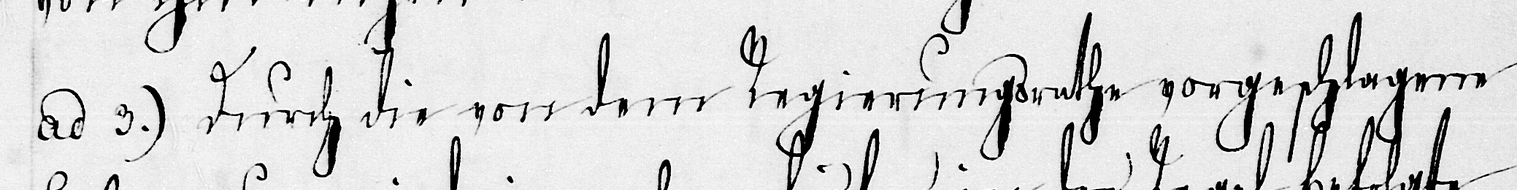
ad 3.) Durch die von dem Regierungsrathe vorgeschlagene
